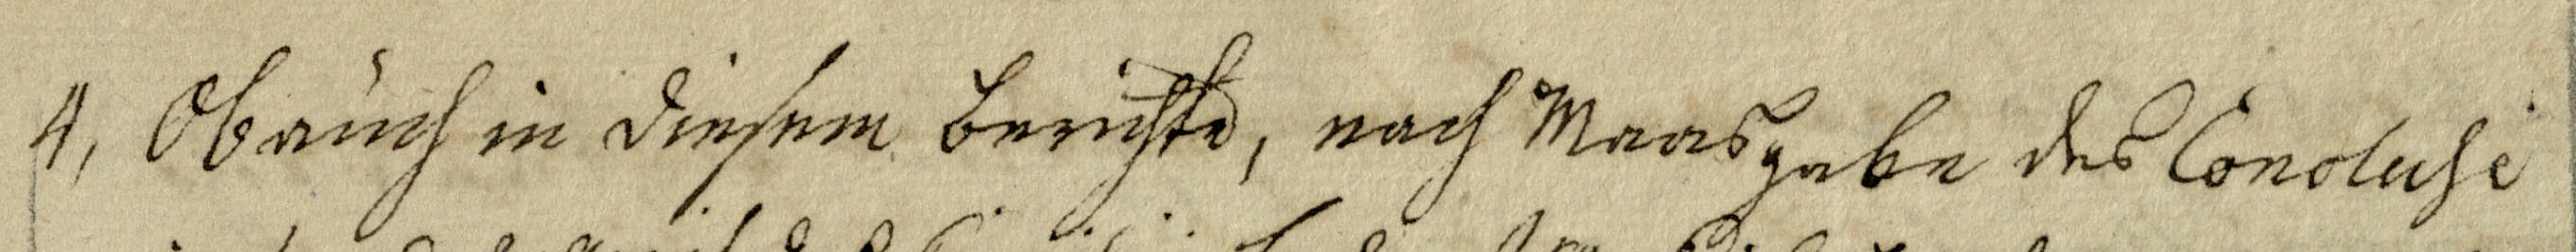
4, Ob auch in diesem Berichte, nach Maasgabe des Conclusi
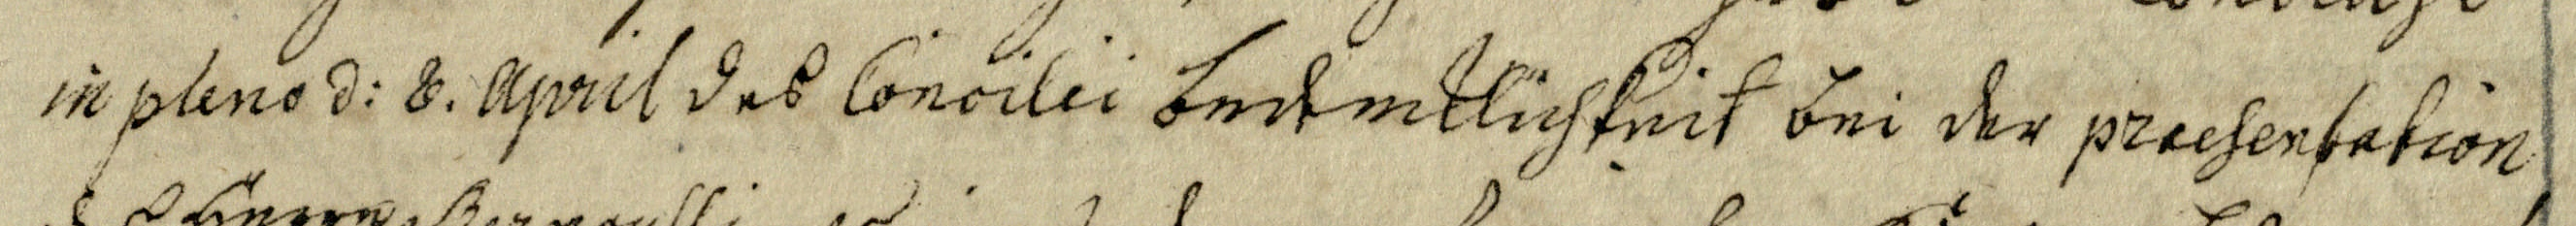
in pleno d. 8. April des Concilii Bedencklichkeit bei der praesentation¬
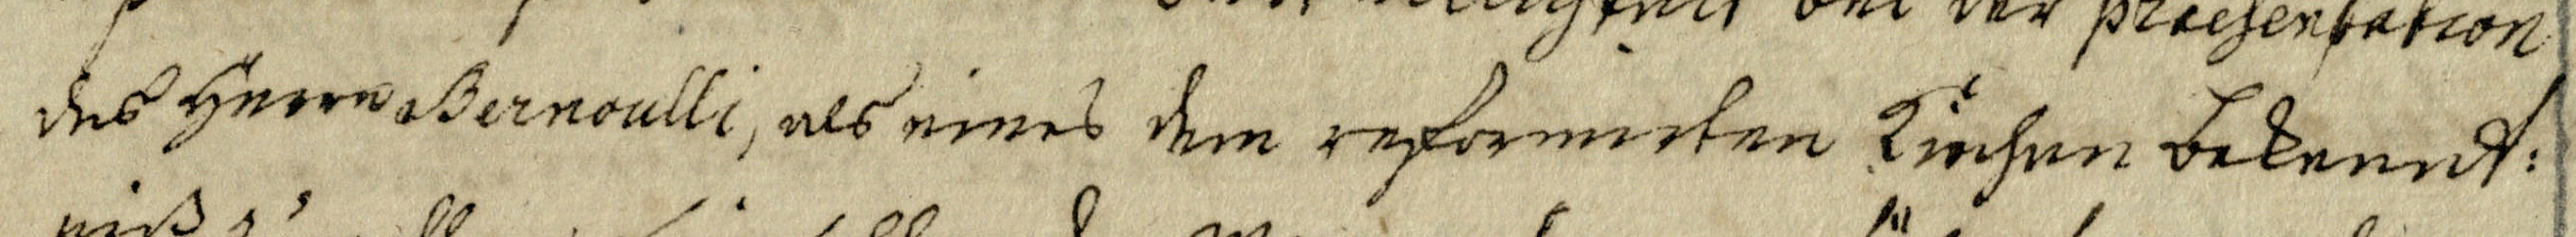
des Herrn Bernoulli, als eines dem reformirten Kirchen Bekennt¬
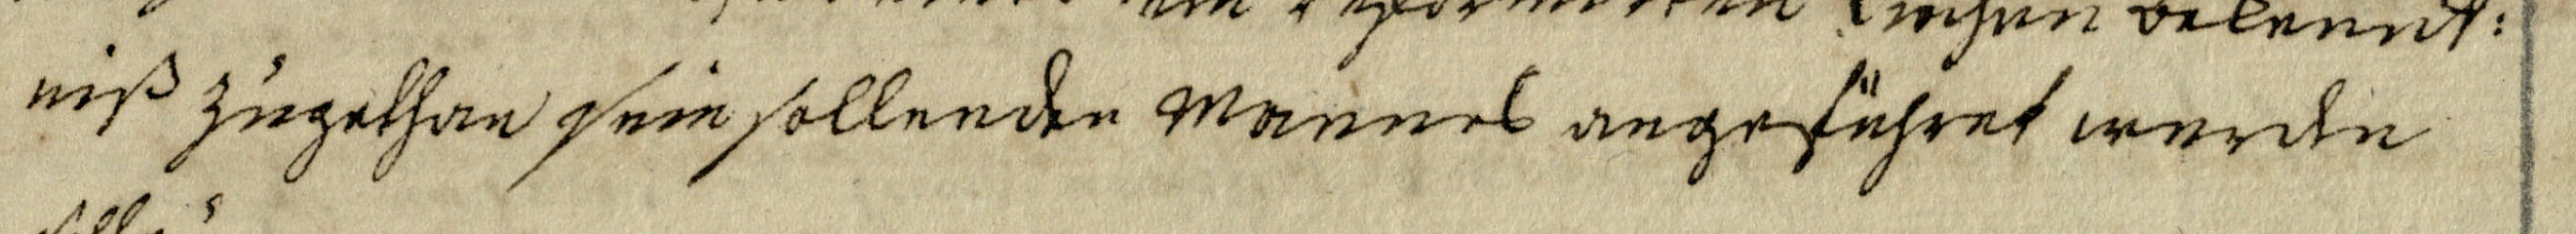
niß zugethan sein sollenden Mannes angeführet werden
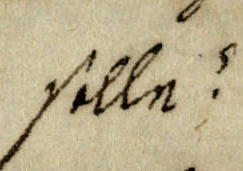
solle?
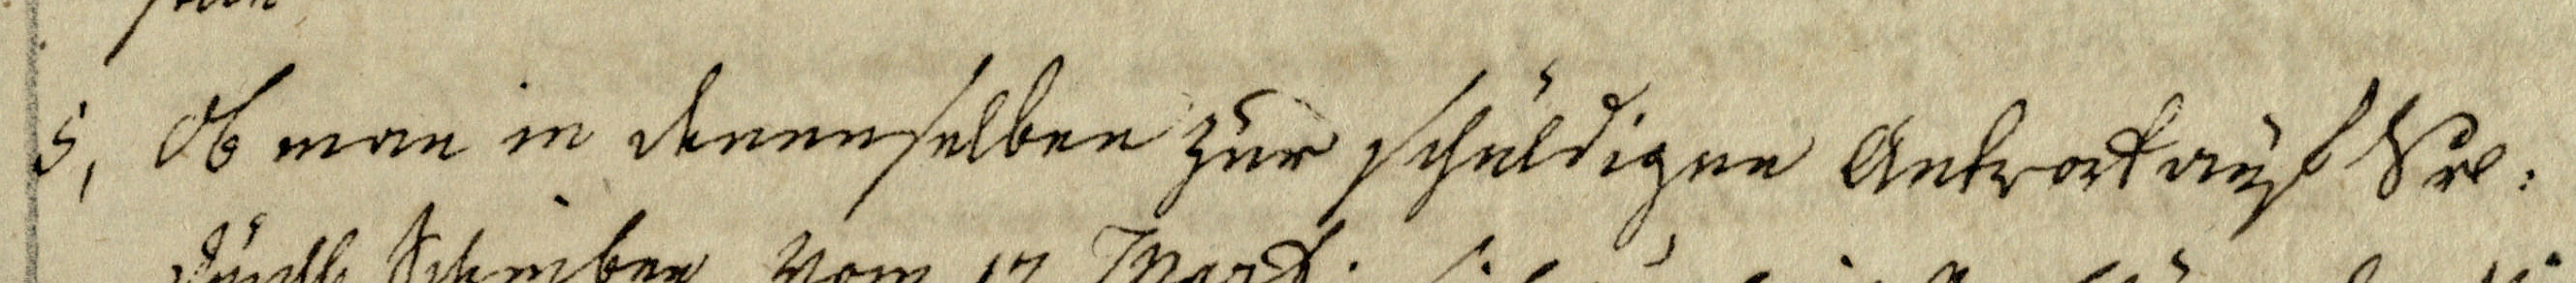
5, Ob man in denenselben zur schuldigen Antwort auf Sr
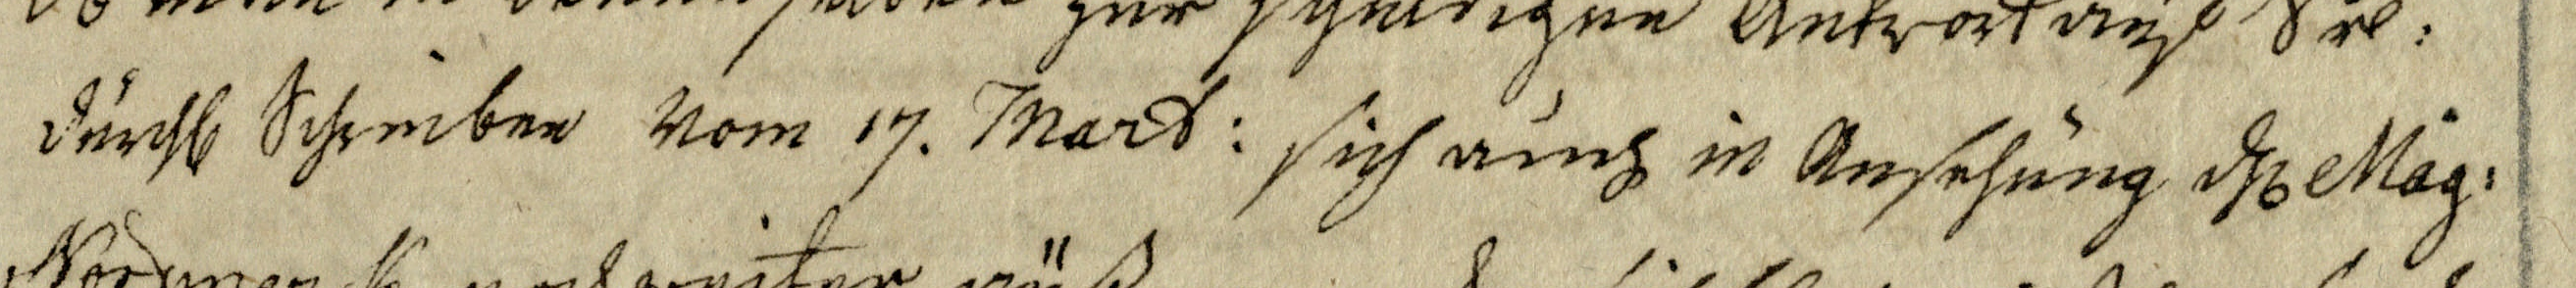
Durchl. Schreiben vom 17. Mart. sich auch in Ansehung dh Mag.
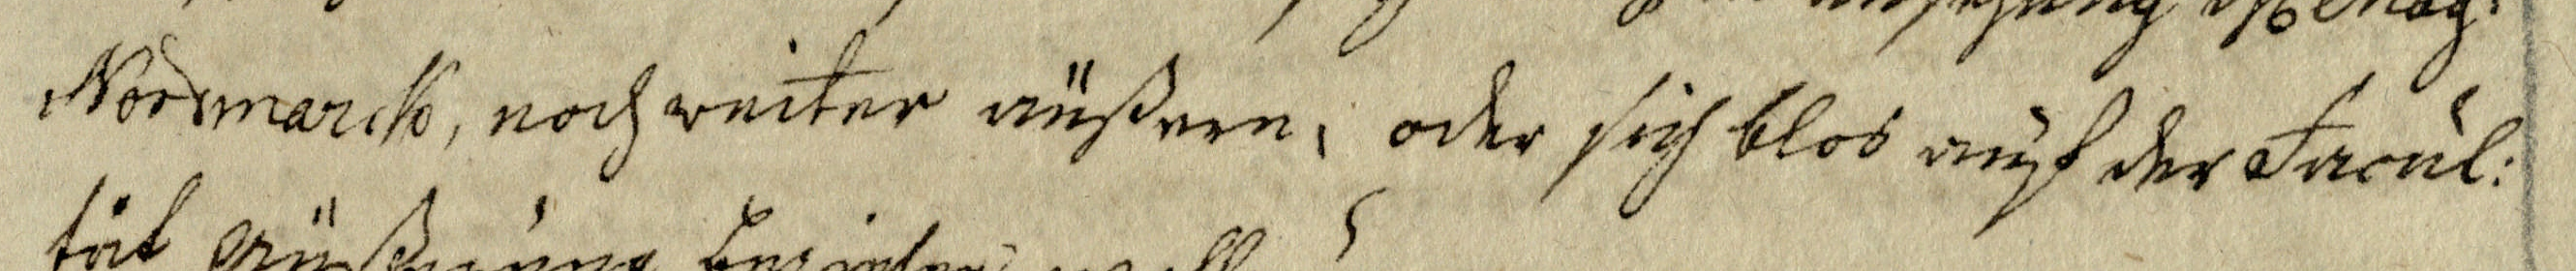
Nordmarck, noch weiter äußern, oder sich blos auf der Facul¬
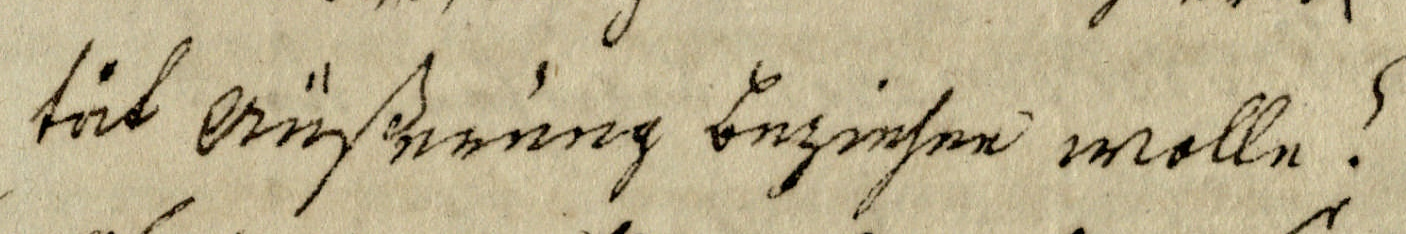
hät Äußerung beziehen wolle?
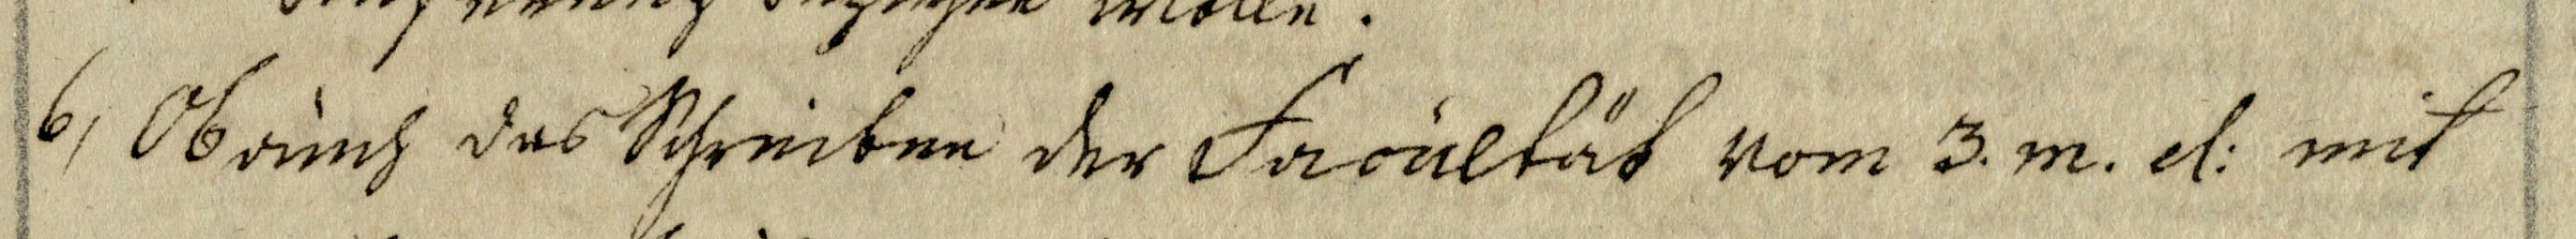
6, Ob auch das Schreiben der Facultät vom 3. m.el. mit
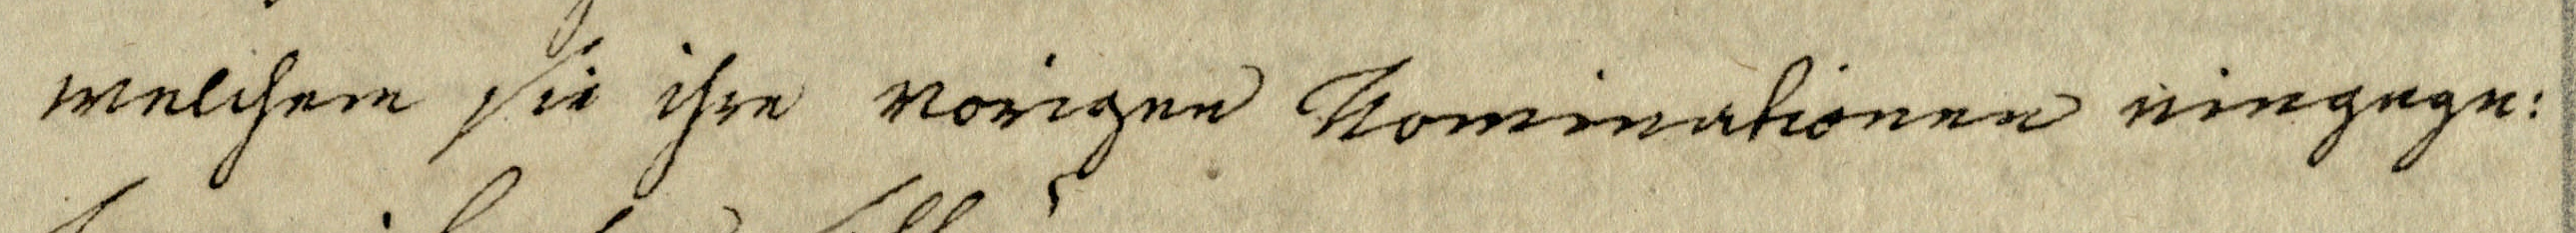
welchem sie ihre vorigen Nominationen eingege¬
